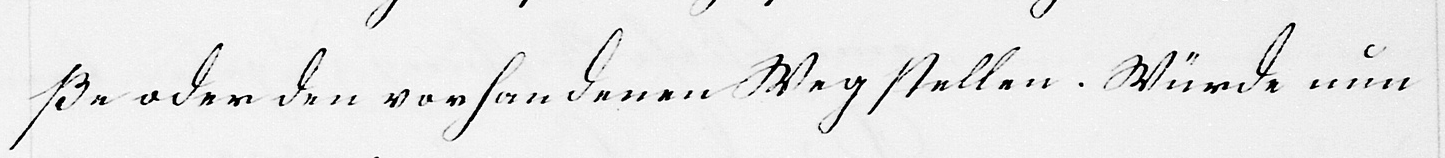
ße oder den vorhandenen Weg stellen. Würde nun
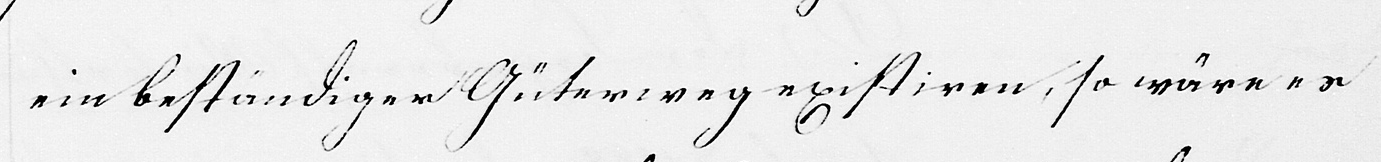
ein beständiger Güterweg existiren, so wäre es
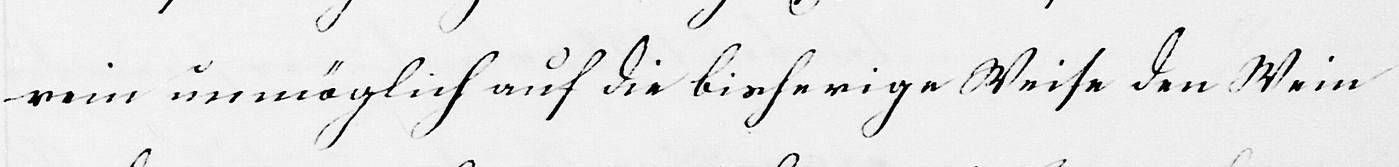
rein unmöglich auf die bisherige Weise den Wein
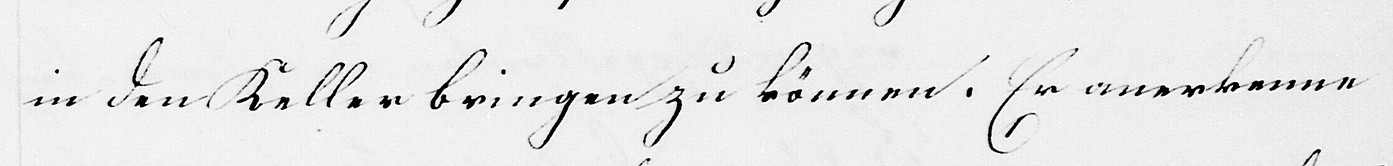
in den Keller bringen zu können. Er anerkenne
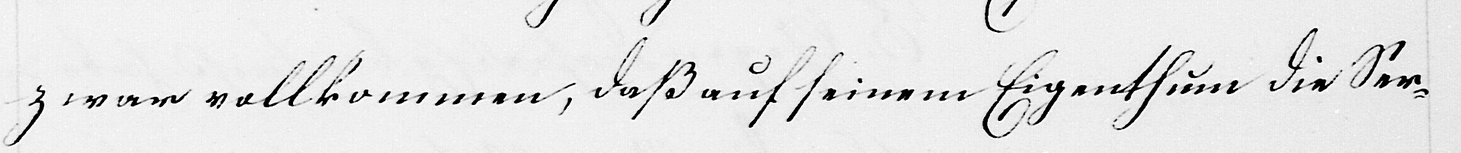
zwar vollkommen, daß auf seinem Eigenthum die Ser¬
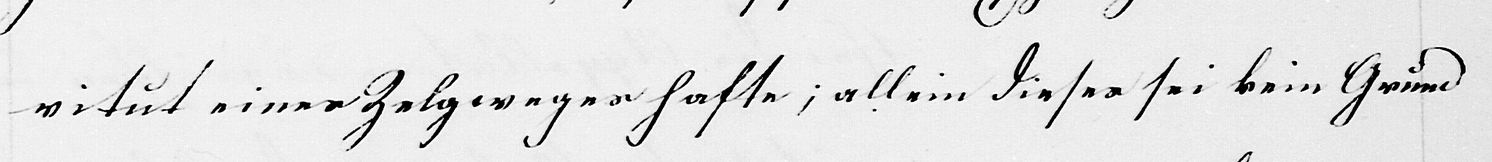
vitut eines Zelgweges hafte; allein dieses sei kein Grund
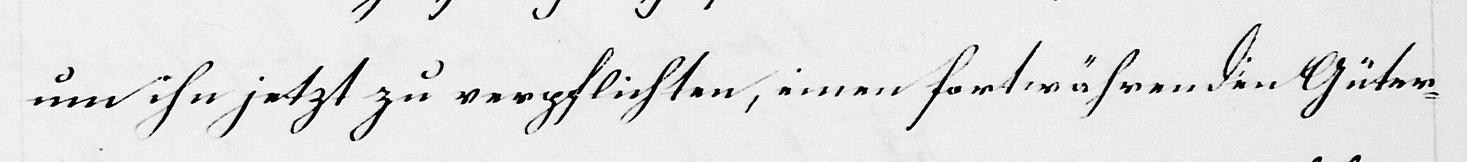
um ihn jetzt zu verpflichten, einen fortwährenden Güter¬
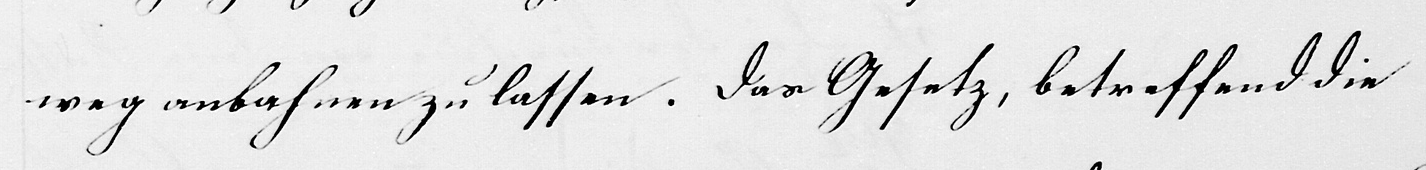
weg anbahnen zu lassen. Das Gesetz, betreffend die
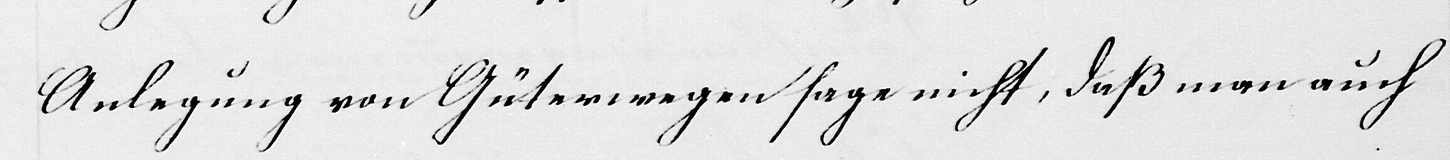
Anlegung von Güterwegen sage nicht, daß man auch
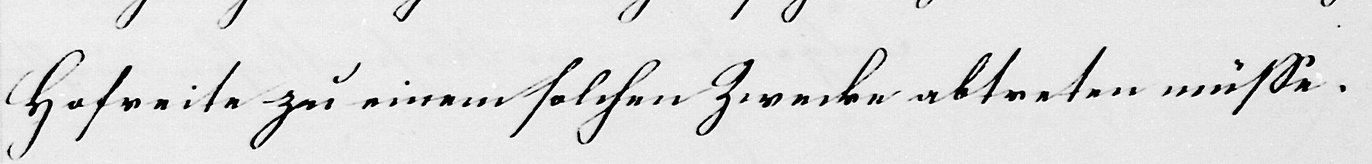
Hofreite zu einem solchen Zwecke abtreten müße.
